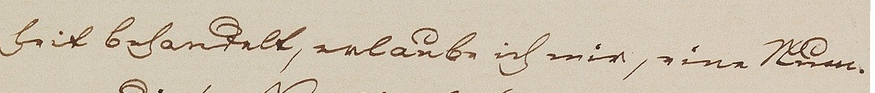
heit behandelt, erlaube ich mir, eine Num-
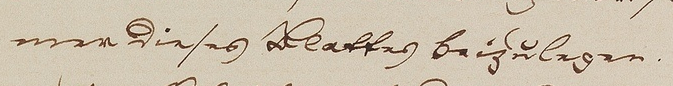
mer dieses Blattes beizulegen.
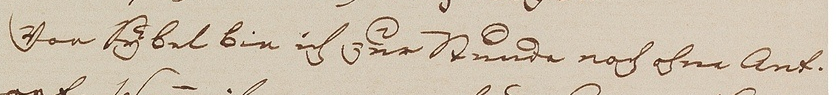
Von Sybel bin ich zur Stunde noch ohne Ant-
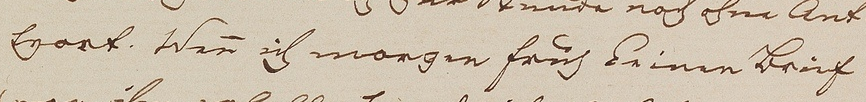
wort. Wenn ich morgen früh keinen Brief
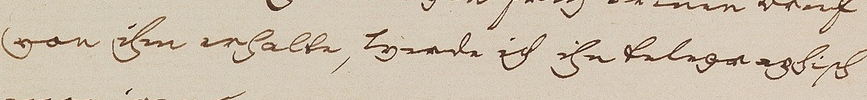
von ihm erhalte, werde ich ihn telegraphisch
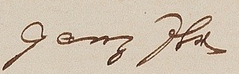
Ganz Ihr
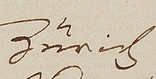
Zürich
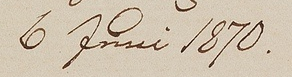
6 Juni 1870.
